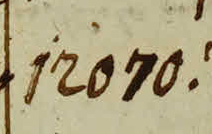12070
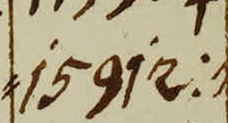15912.
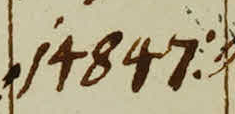14847.
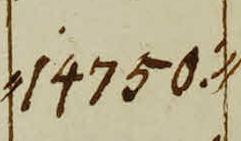14750.
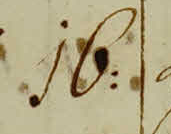16:
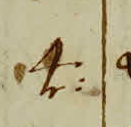4:
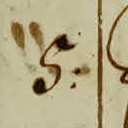5:
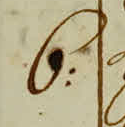6:
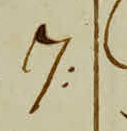7:
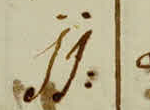11:
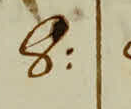8:
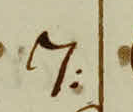7:
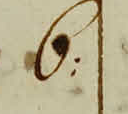6:
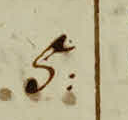5:
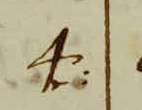4:
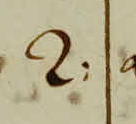2:
